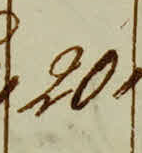20
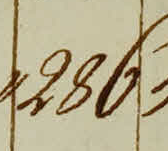286
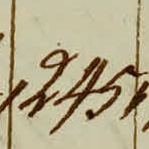245
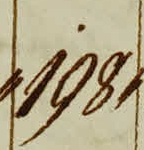198
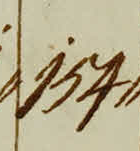154
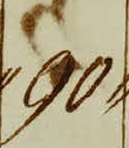90
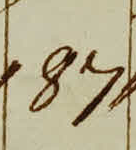87
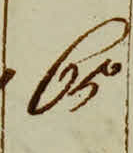65
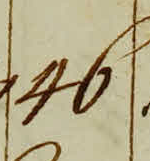46
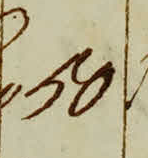50
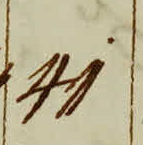41
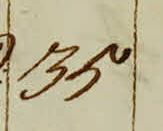35
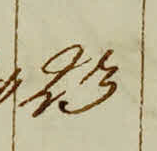23
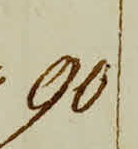90
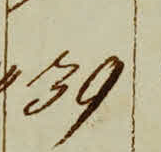39
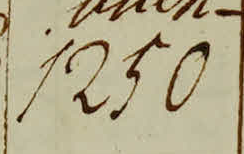1250
